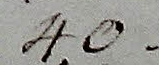40
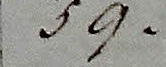59
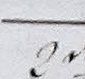2
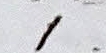1
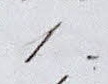1
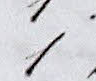1
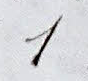1
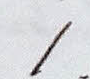1
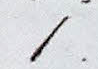1
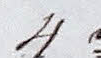4
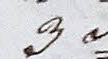3
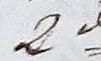2
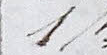1
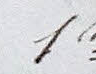1
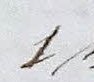1
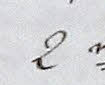2
